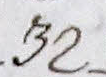32
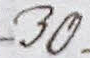30
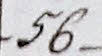56
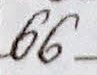66
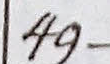49
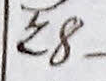28
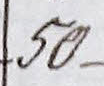50
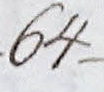64
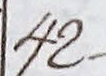42
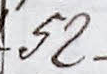52
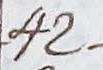42
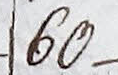60
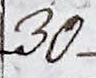30
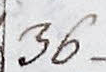36
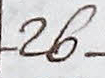26
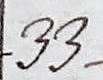33
